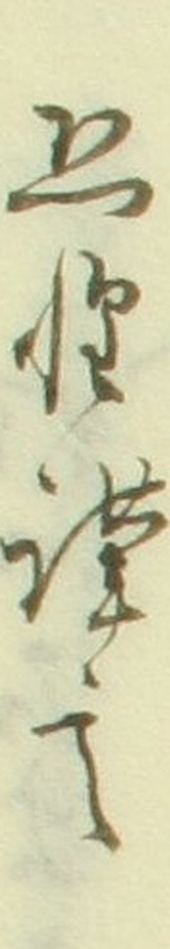恐々謹言
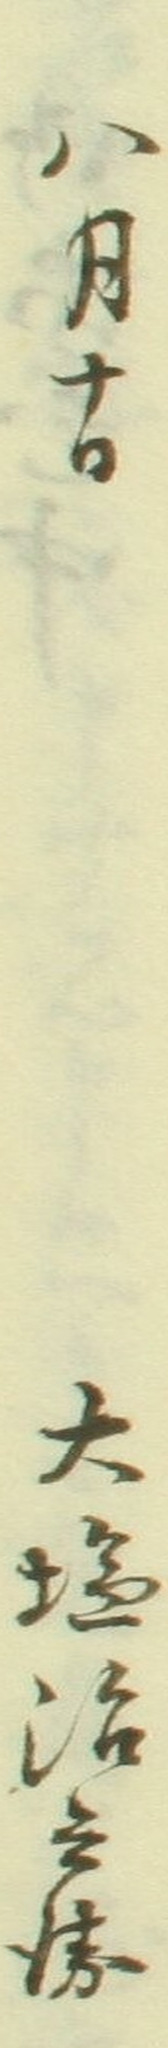八月十日大塩治兵衛

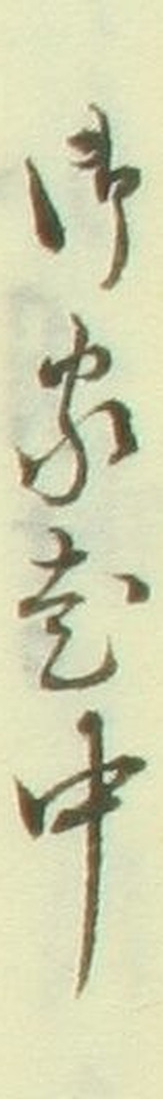御家老中
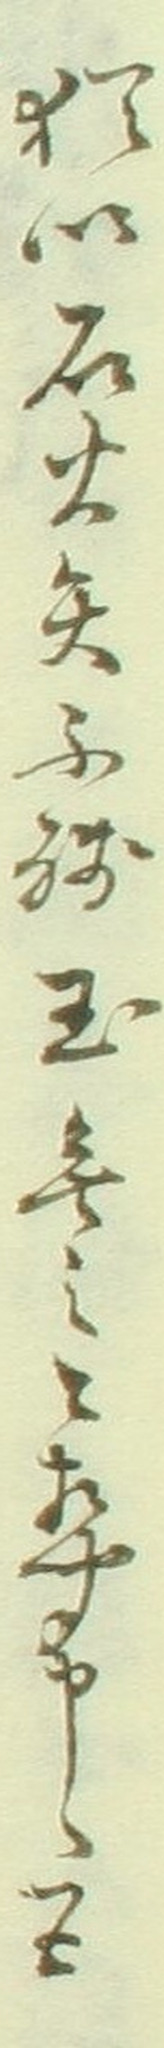猶御石火矢不残玉無之と相聞申候以上
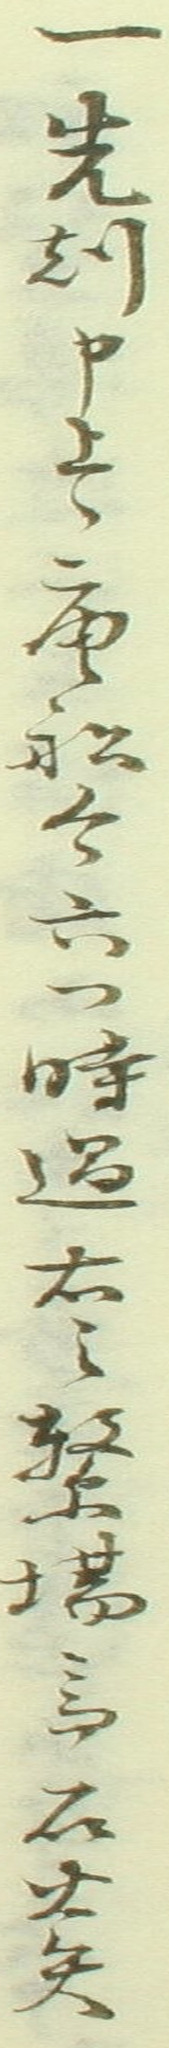一先刻申上候唐船今六つ時過右之繋場に而石火矢
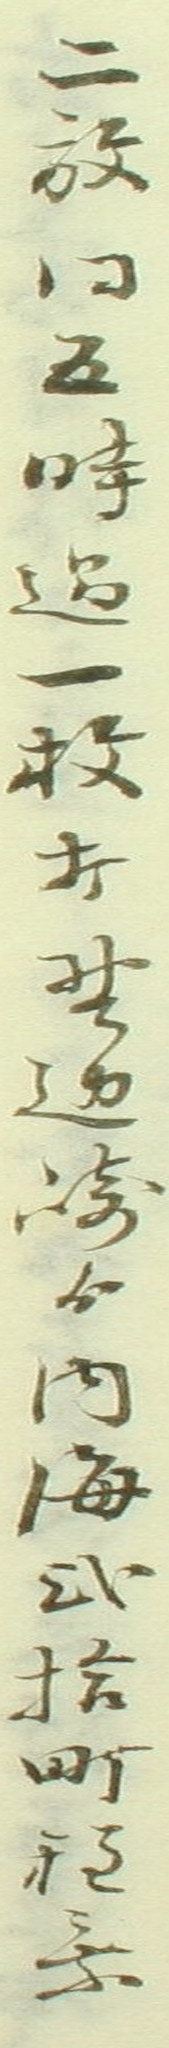ニ放同五時過一枚打野辺崎ゟ内海弐拾町程乗
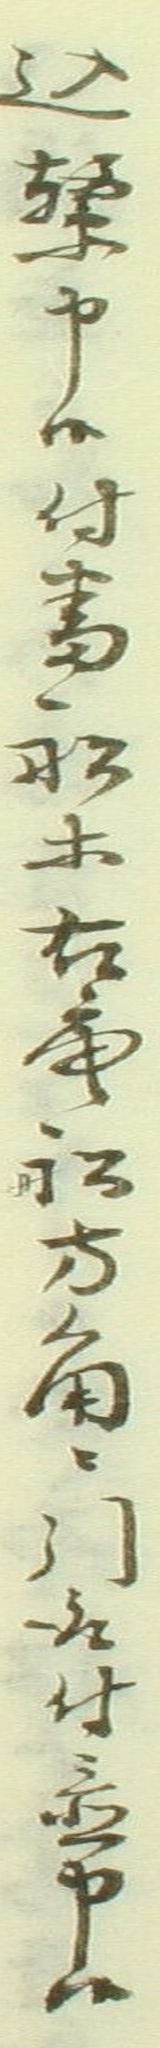込繋申候付番船等右唐船方角に引取付に置申候
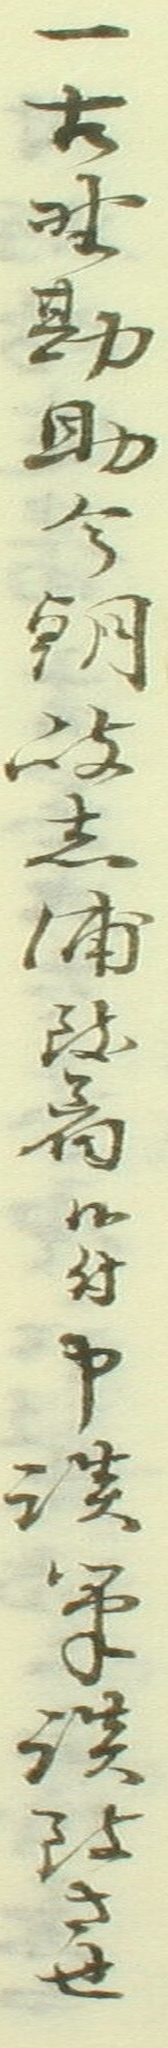一古野勘助今朝岐志浦致着候付申談筆談致させ
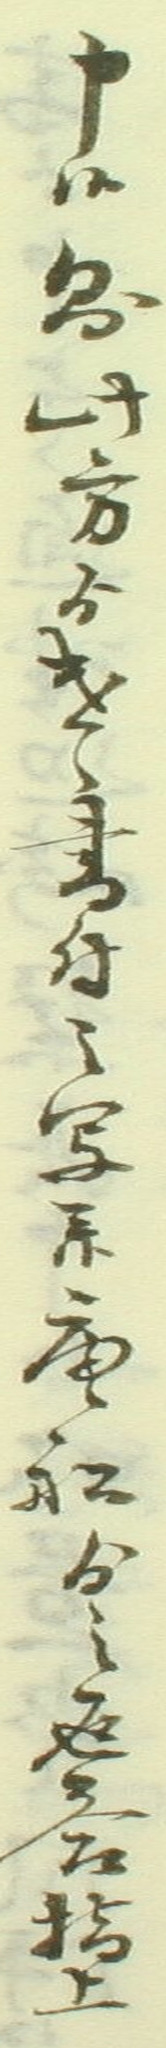申候則此方ゟ遣候書付之写并唐船ゟ之返答指上
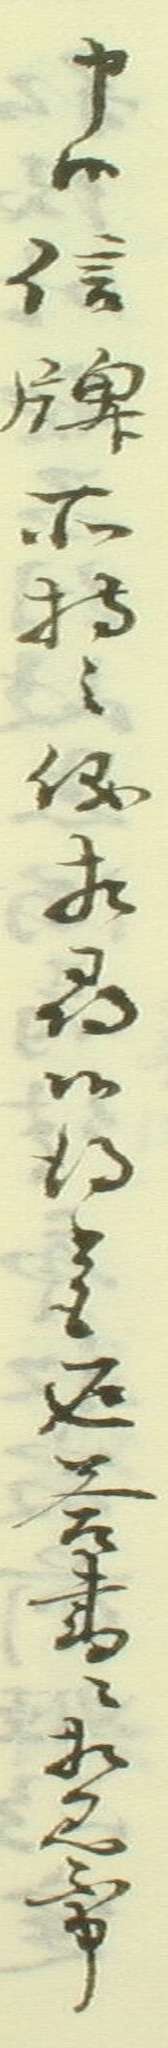申候信牌所持之儀相尋候得とも返答書に相見不申
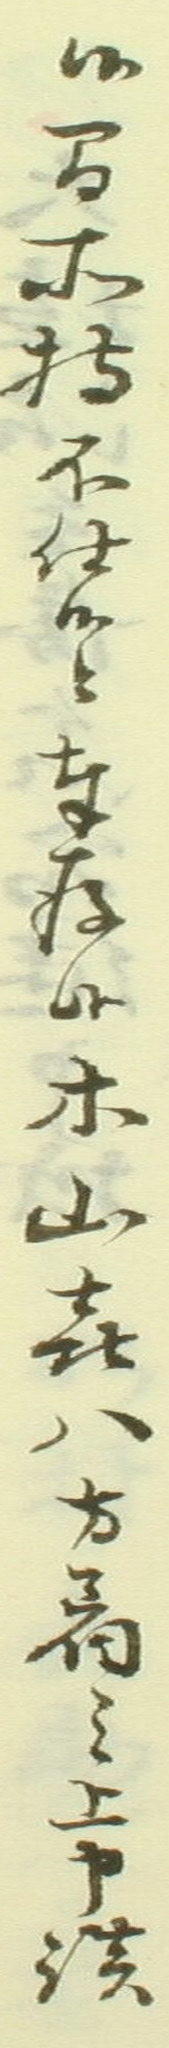候間所持不仕候と奉存候木山喜八方着之上申談
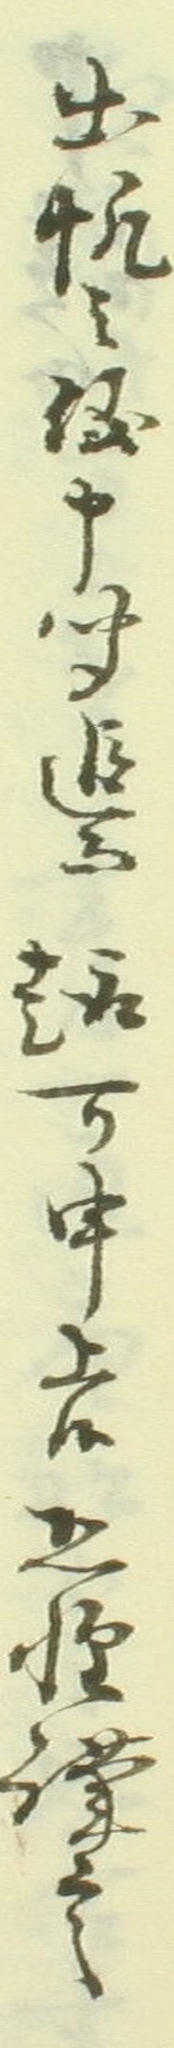出帆之儀申聞追而趣可申上候恐々謹言
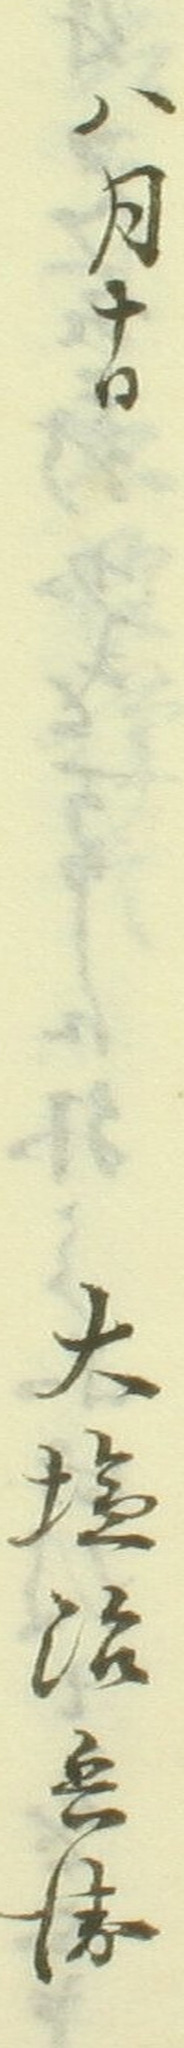八月十日大塩治兵衛
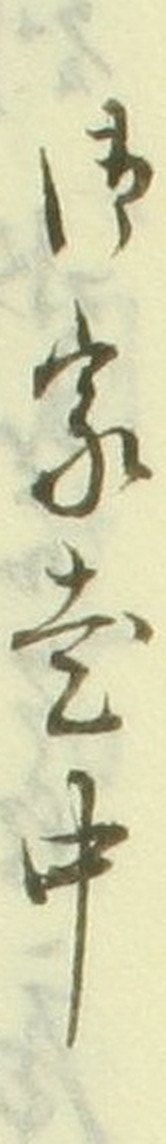御家老中
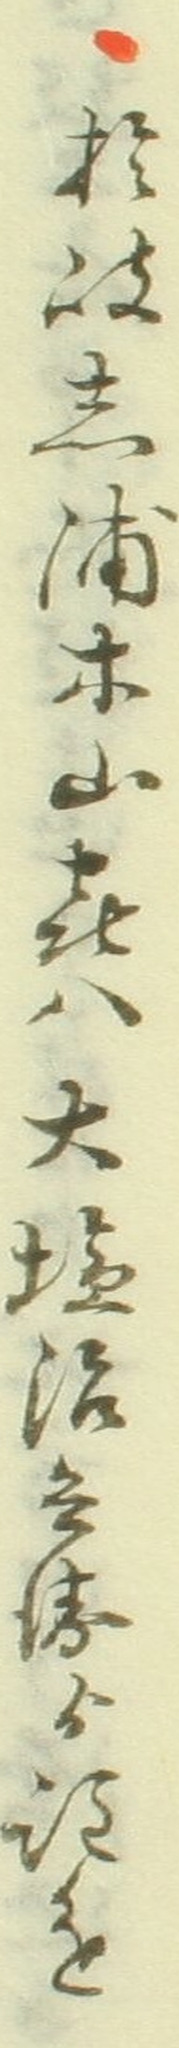於岐志浦木山喜八大塩治兵衛ゟ注進
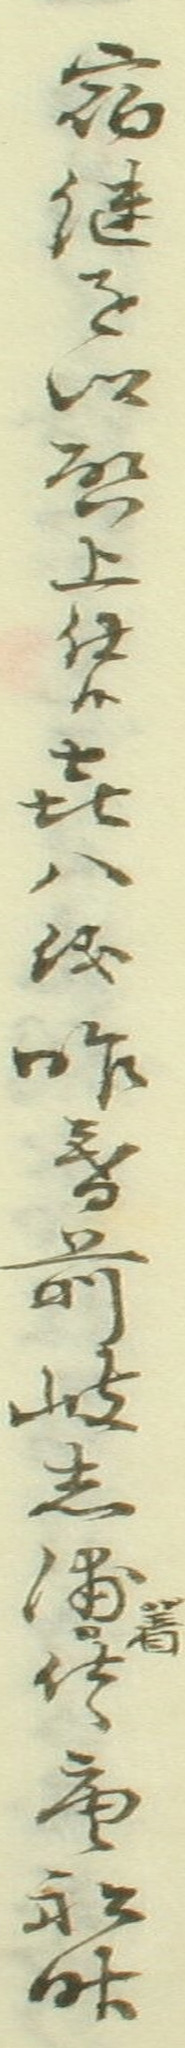宿継を以啓上仕候喜八儀昨暮前岐志浦◦仕候唐船昨
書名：異国船漂着記
